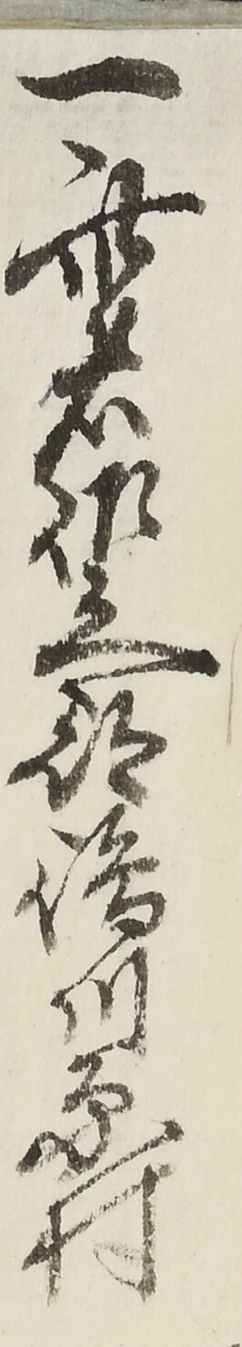一此者佐久郡島川原村
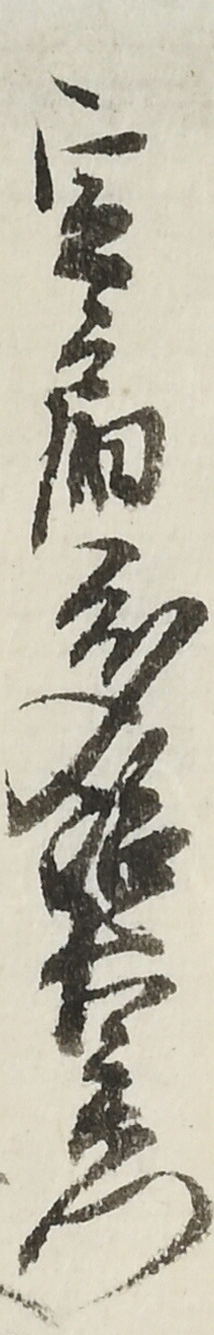定宿多治右衛門

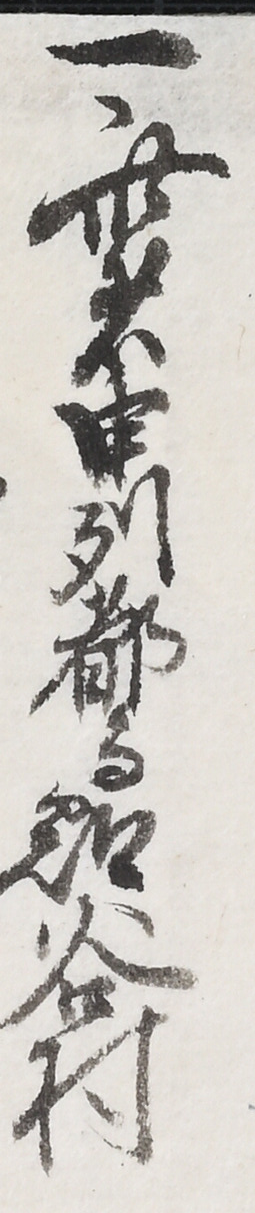一此者甲州都留郡谷村
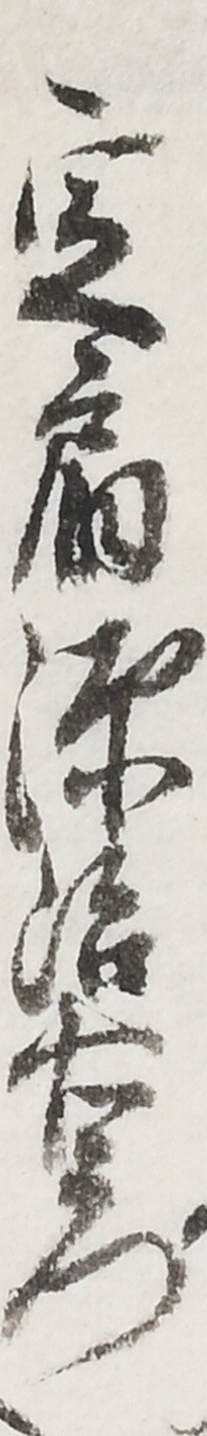定宿源治右衛門
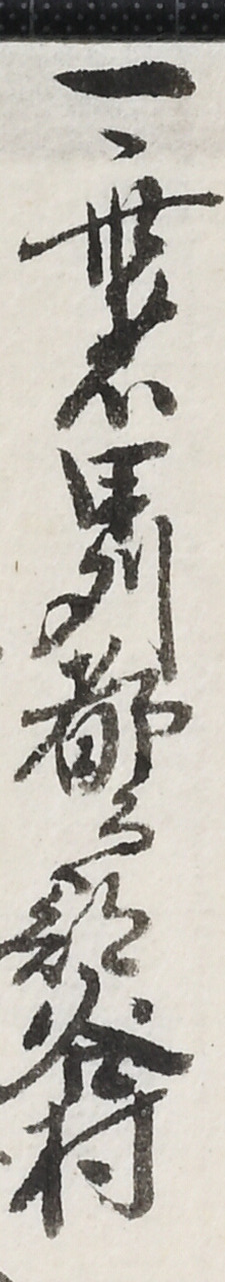一此者甲州都留郡谷村
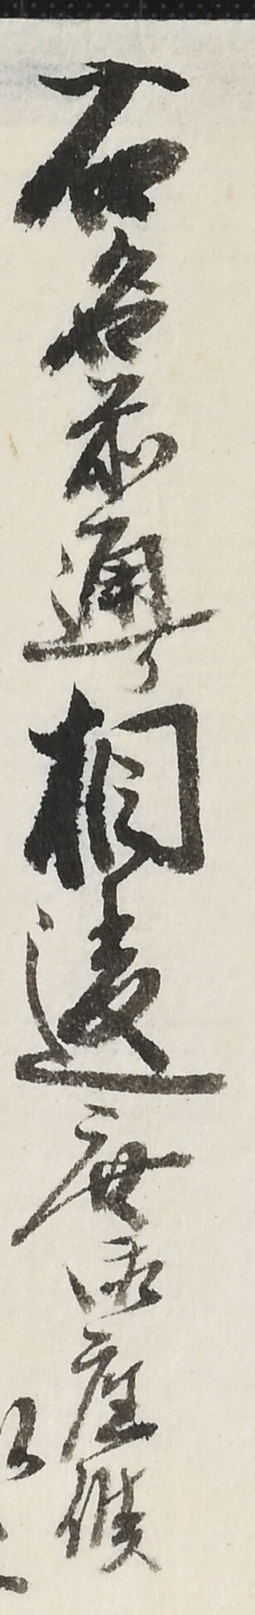右名前通り相違無御座候
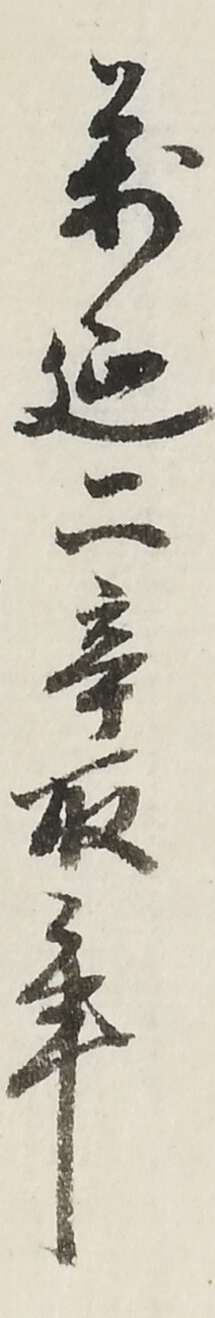万延二辛取年
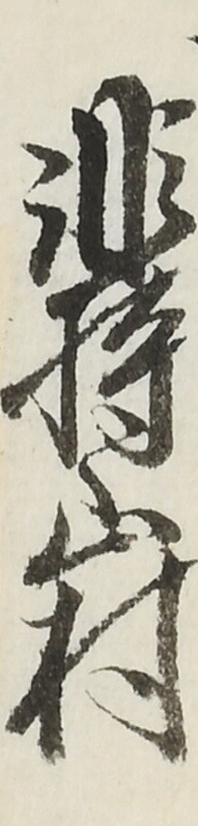非持山村

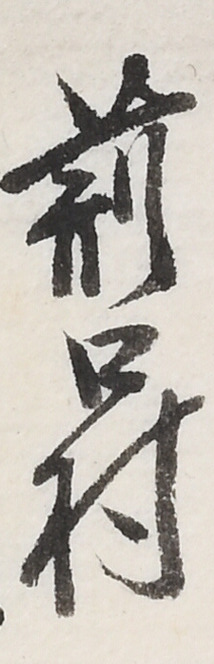荊口村
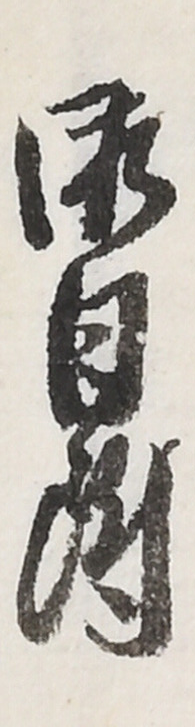御目附
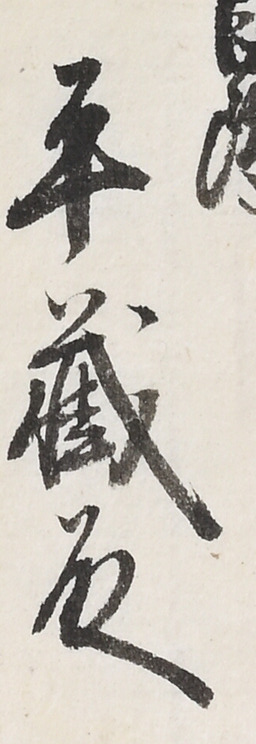平蔵殿
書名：萬延二年辛取（酉）年正月他国石切名前書上帳
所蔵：伊那市立高遠町図書館・合同会社AMANE
